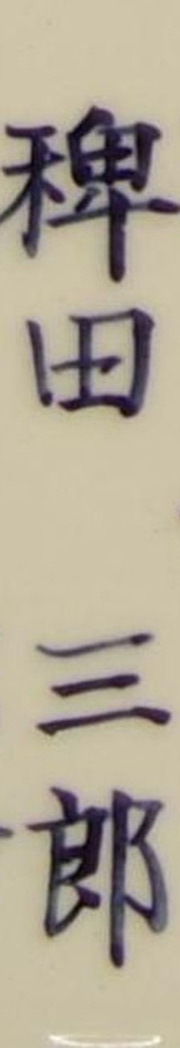稗田三郎
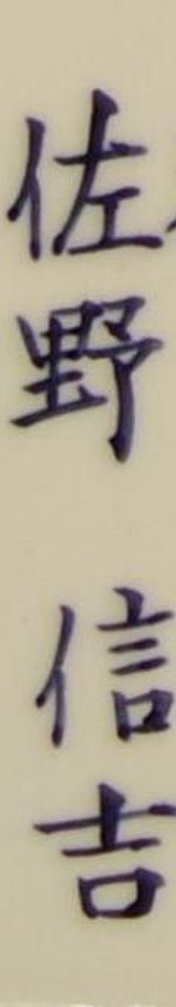佐野信吉
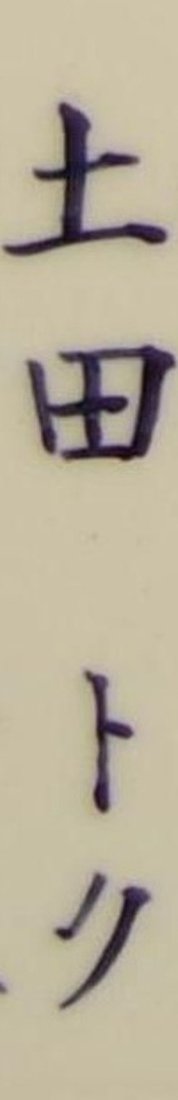土田トク
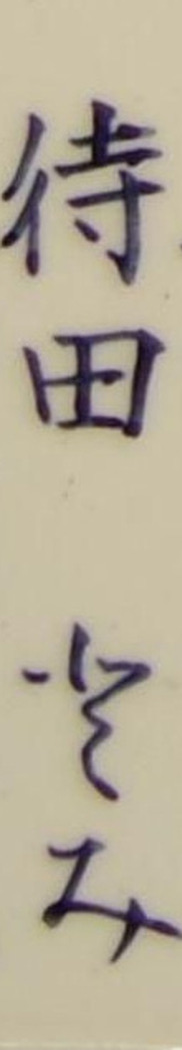待田とみ
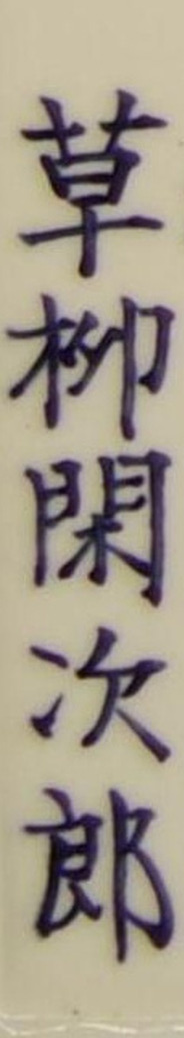草柳閑次郎

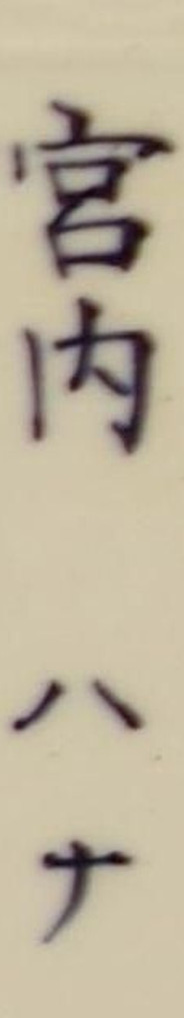宮内ハナ
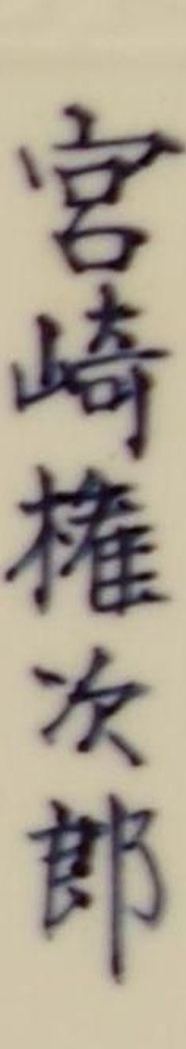宮崎権次郎
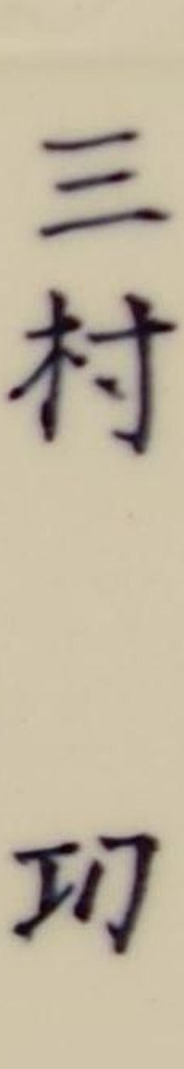三村㓛
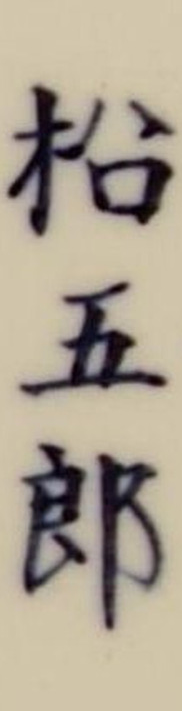松五郎
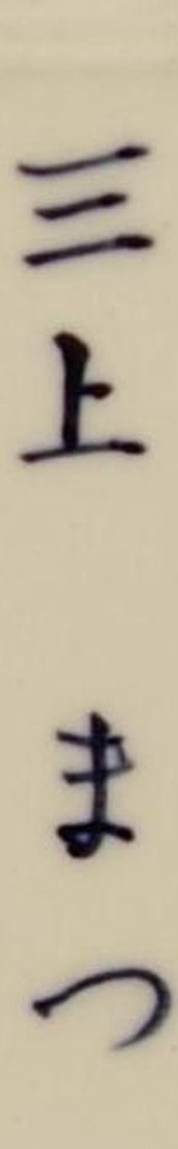三上まつ
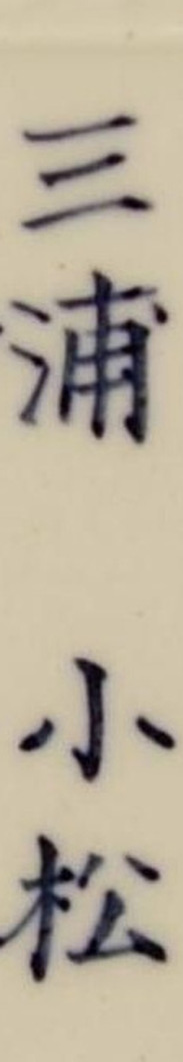三浦小松
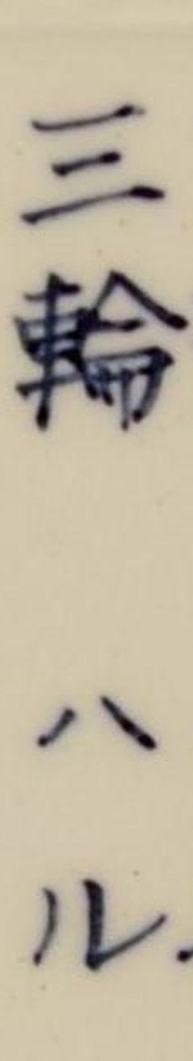三輪ハル
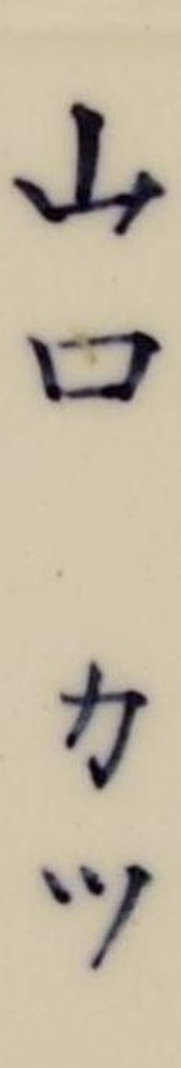山口カツ
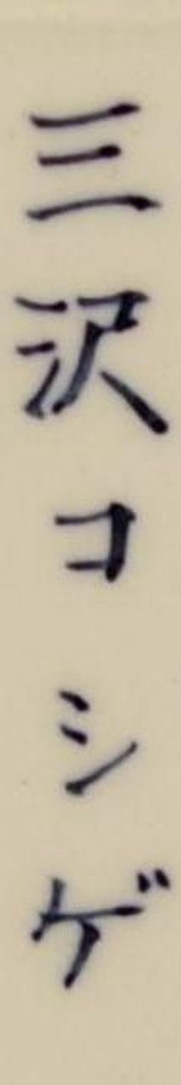三沢コシゲ
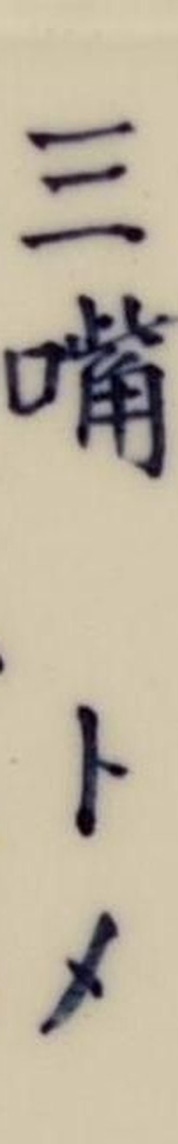三嘴トメ
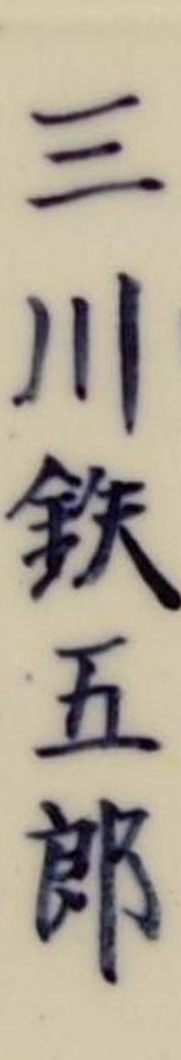三川鉄五郎
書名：E~L
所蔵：高野山金剛峯寺
